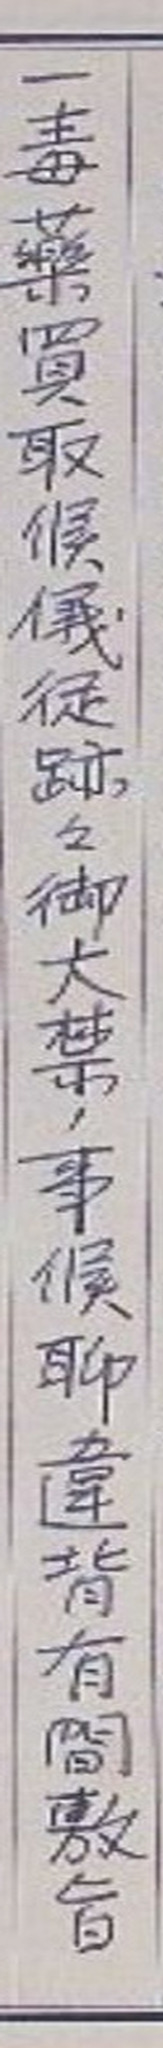一毒薬買取候儀従跡々御大禁の事候聊違背有間敷旨
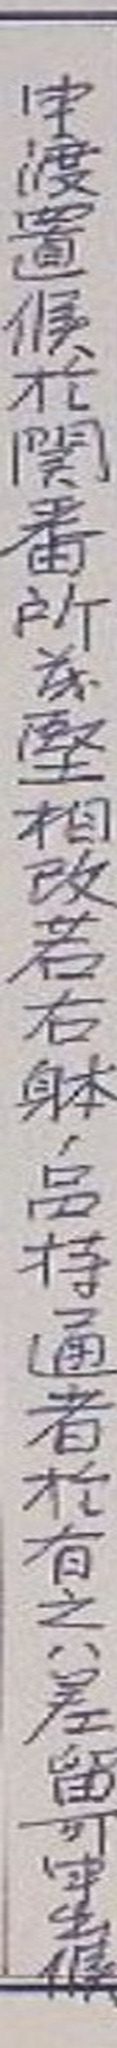申渡置候於関番所も堅相改若右躰の品持通者於有之は差留可申出候
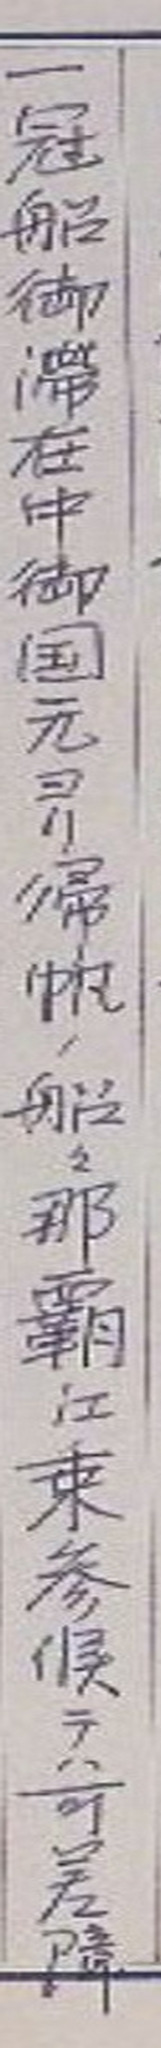一冠船御滞在中御国元より帰帆の船々那覇え乗参候ては可差障
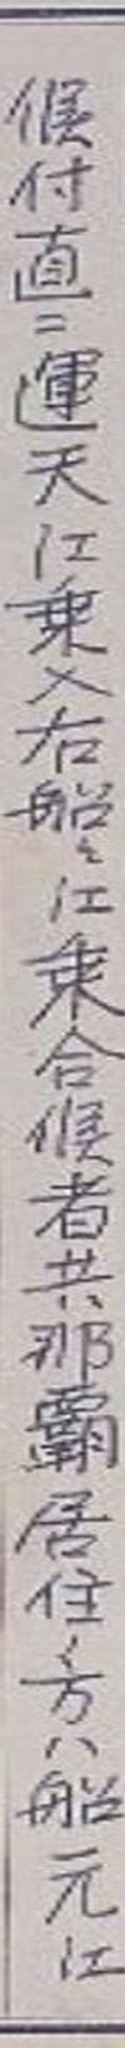候付直に運天え乗入右船々え乗合候者共那覇居住の方は船元え

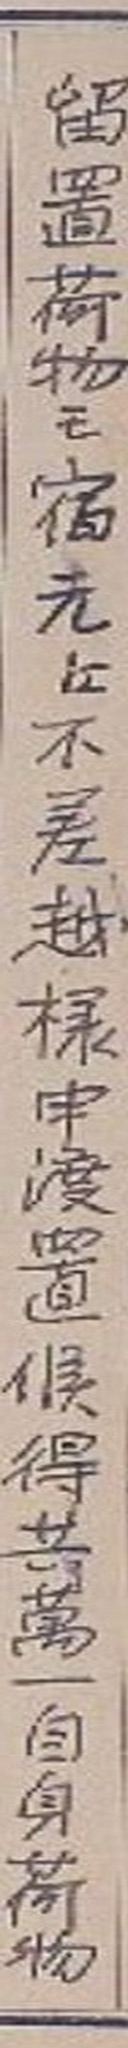留置荷物も宿元え不差越様申渡置候得共万一自身荷物
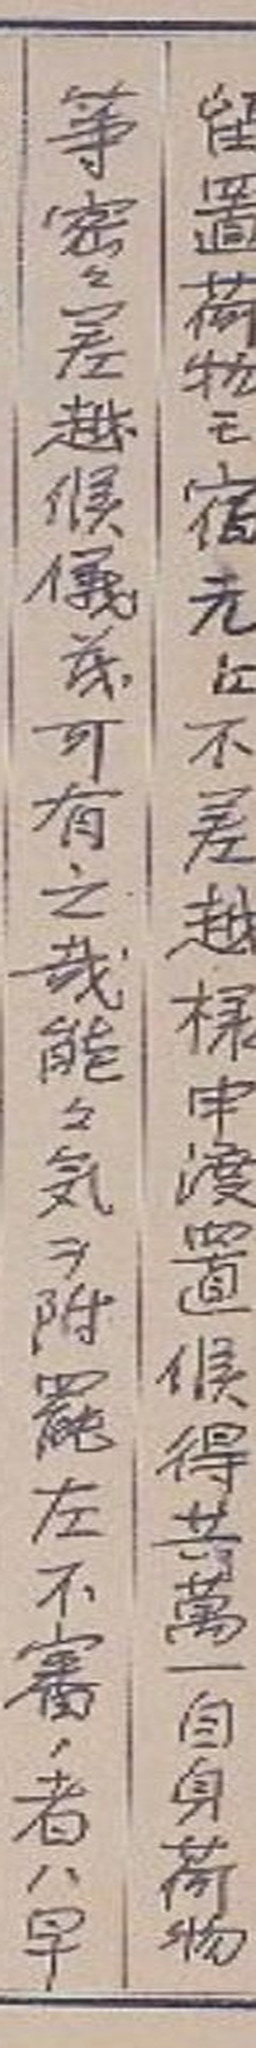等密々差越候儀も可有之哉能々気を附罷左不審の者は早
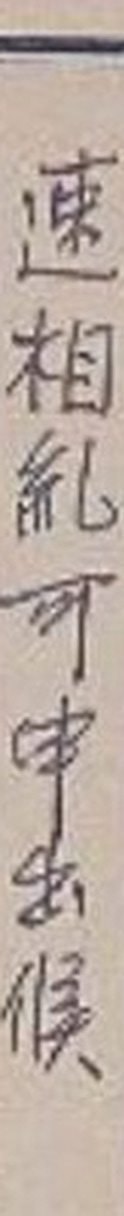速相糺可申出候
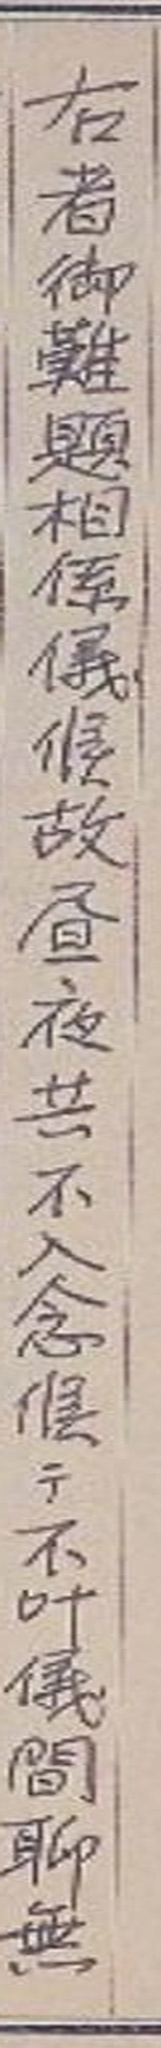右者御難題相係儀候故昼夜共不入念候て不叶儀間聊無
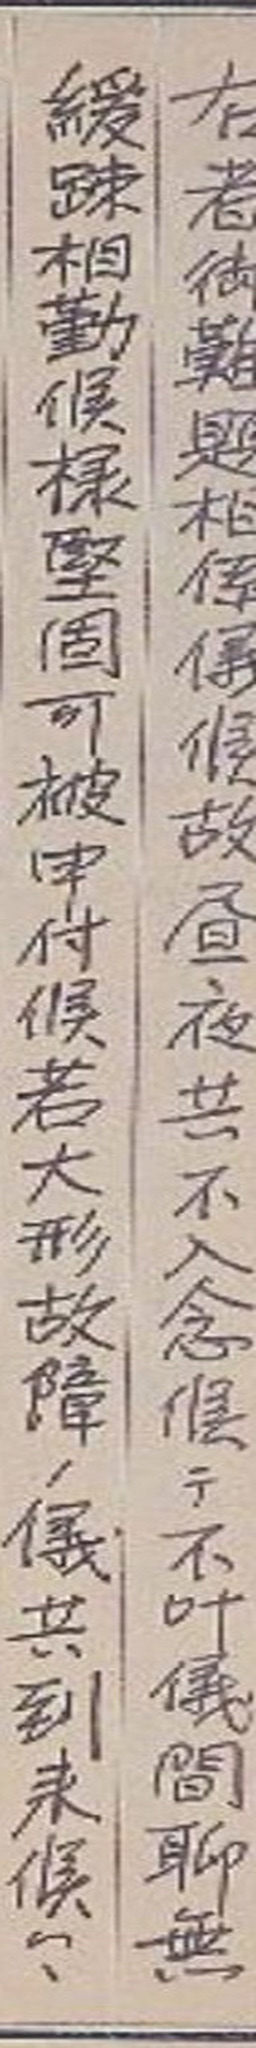緩疎相勤候様堅固可被申付候若大形故障の儀共到来候はゝ
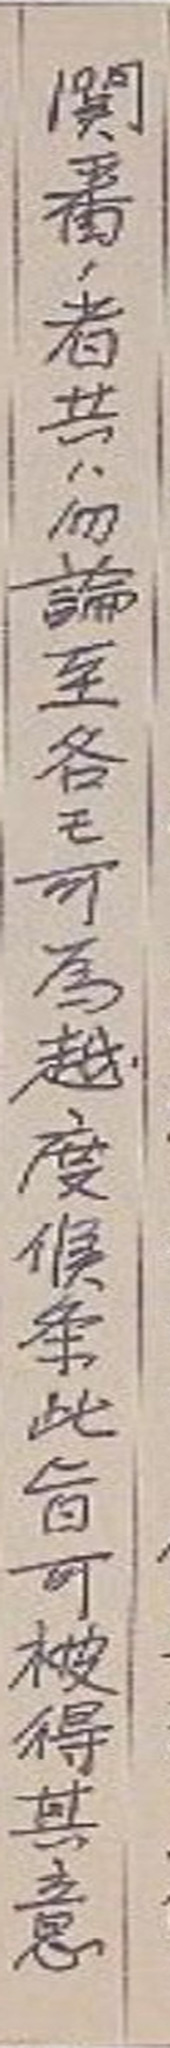関番の者共は勿論至各も可為越度候条此旨可被得其意
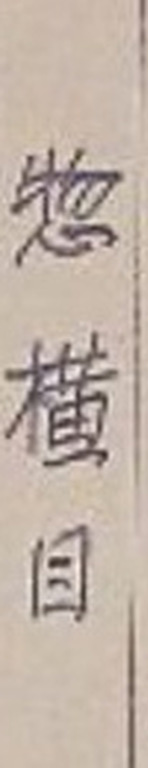惣横目
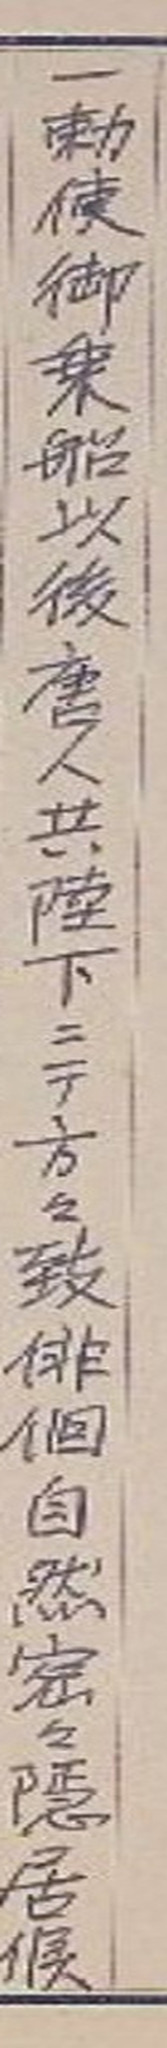一勅使御乗船以後唐人共陸下にて方々致徘徊自然密々隠居候
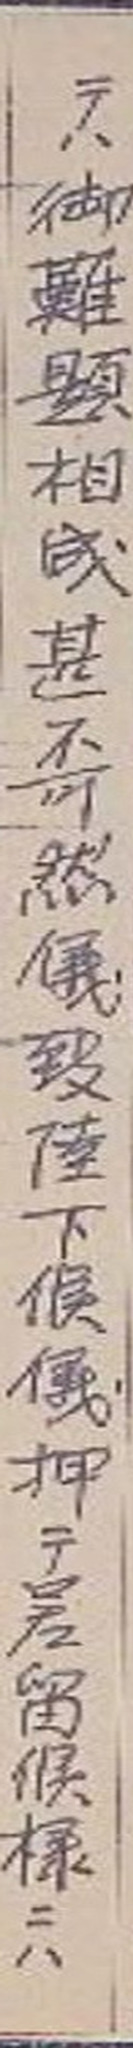ては御難題相成甚不可然儀致陸下候儀押て差留候様には
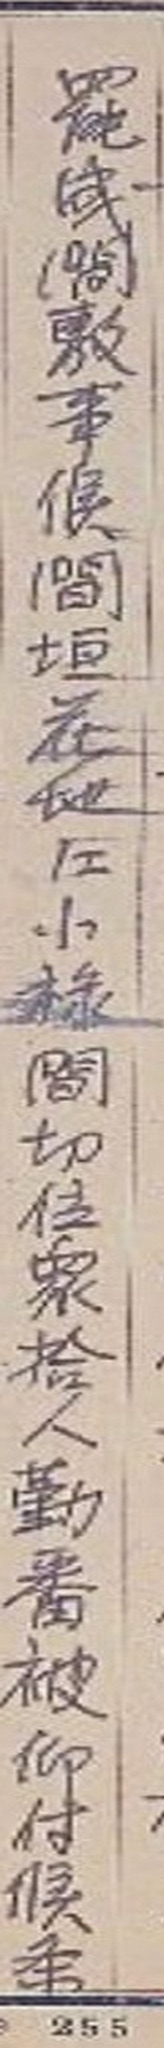罷成間敷事候間垣花地え小禄間切位衆拾人勤番被仰付候条
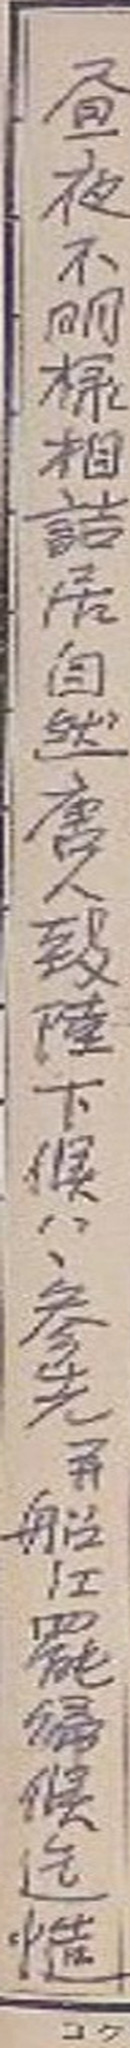昼夜不明様相詰居自然唐人致陸下候はゝ参先并船え罷帰候迄慥
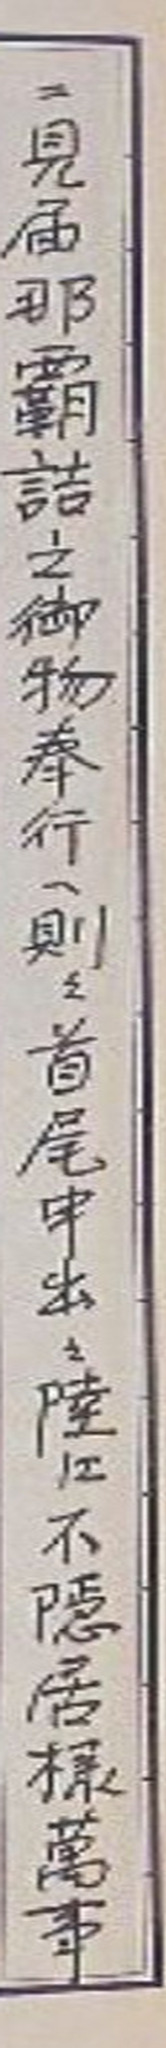に見届那覇詰之御物奉行へ則々首尾申出々陸え不隠居様万事
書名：支那冊封使来琉諸記 下巻
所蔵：University of the Ryukyus Library
